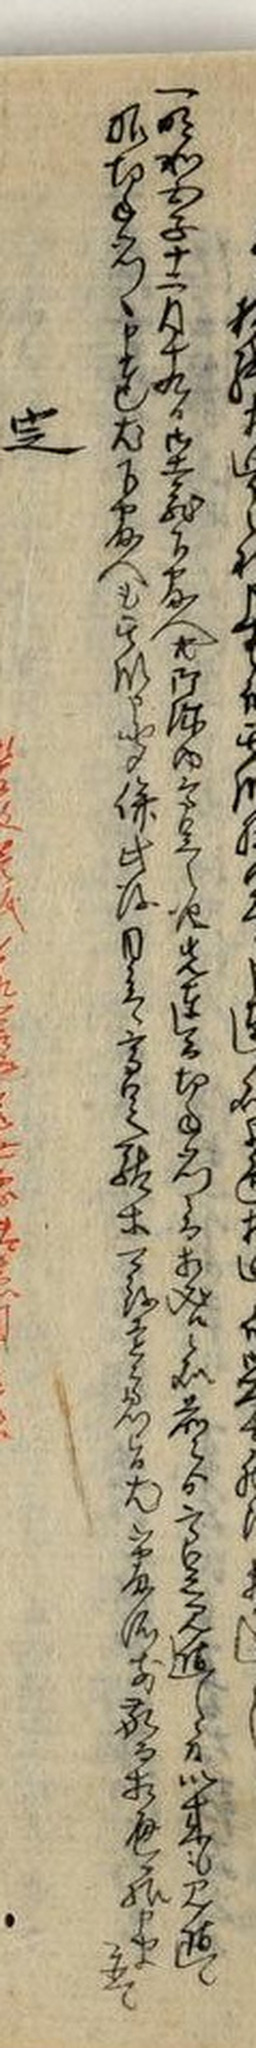様切手御門へ申達尤下番人も其段申聞併此後目立候高足駄等可致遠慮旨尤御番所前敬而相通候様申聞置候
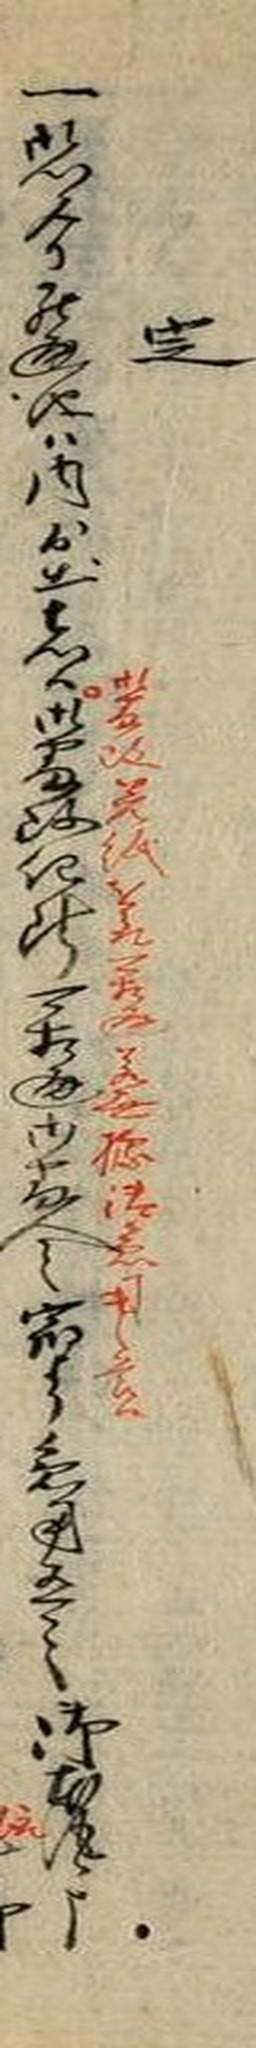一御門〆り罷通儀は内ゟ出者は○御番改任断可相通御番人之宿より急用有之御本丸へ申
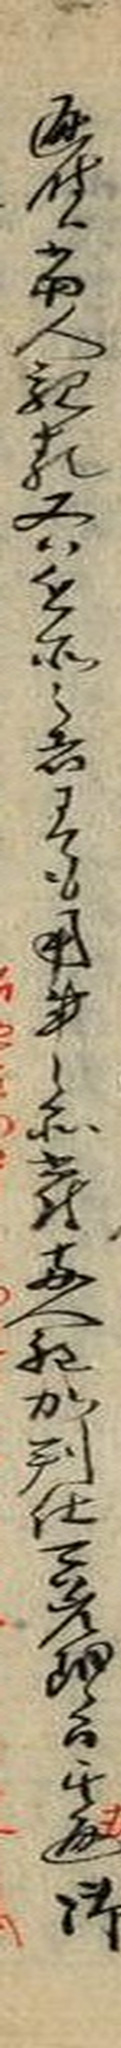通時は当人親類又は近所之者にても用事之品書付両人程加判仕可差越候間其趣御
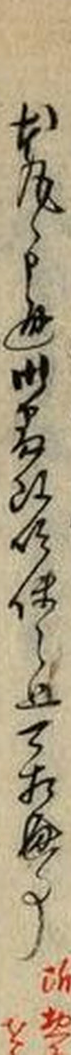本丸へ申通御番改吟味之上可相通事
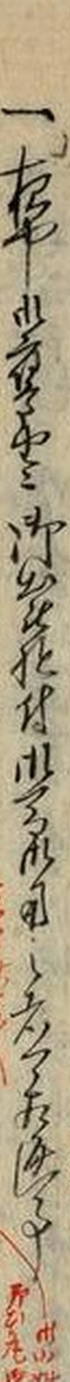一夜中御鷹野に御出被遊付御馬御用之者可相通候事
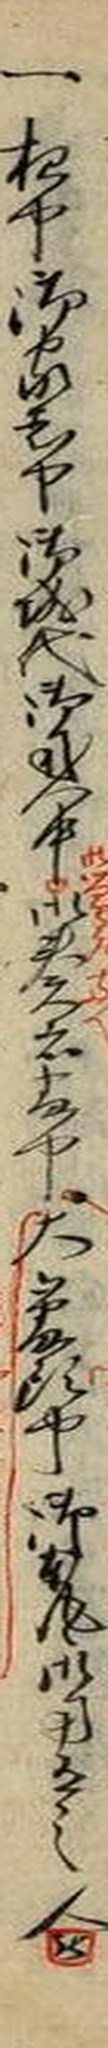一夜中御家老中御城代御用人中○御奏者番中大番頭中●御本丸へ御用有之人
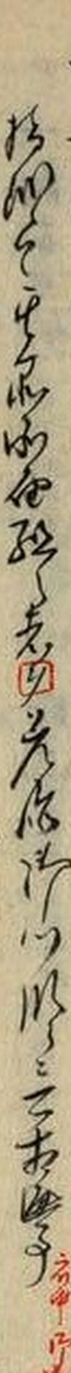指越候はゝ其品承届組之者差添御門段々に可相通候事
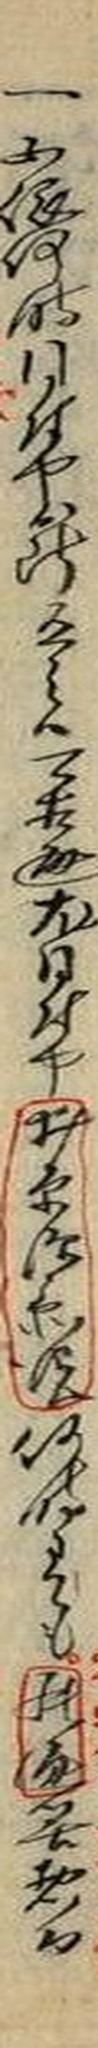一不依何時目付中ゟ断有之は可相通尤目付中井原源兵衛儀は何時にても○罷通候筈惣而
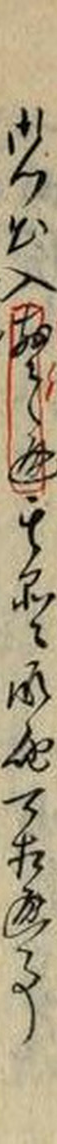御門出入前々之通其品々承届可相通候事
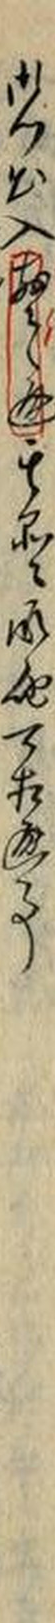御門出入前々之通其品々承届可相通候事
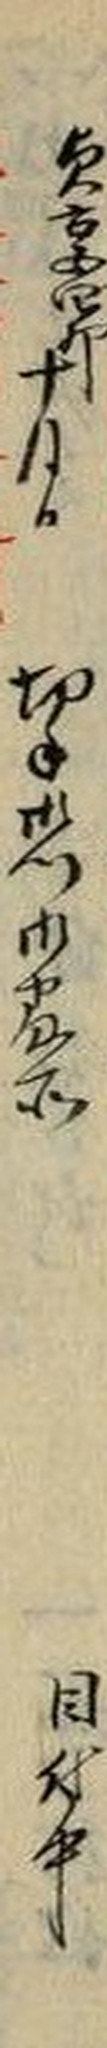貞享四卯十月切手御門御番所目付中
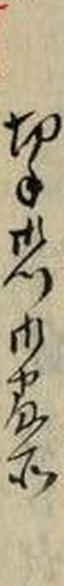切手御門御番所
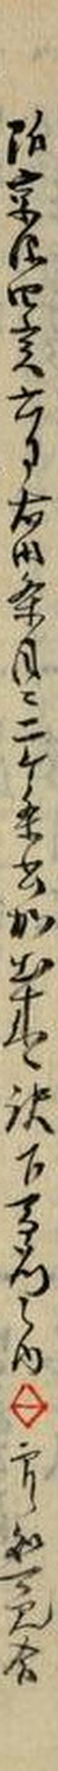附享保四亥六月右御条目に二ヶ条書加出来候訳下馬御門之内◇印処可見合
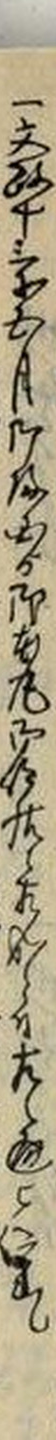一文政十三寅五月御帰国ゟ御本丸御住居に相成候に付左之通被仰出候
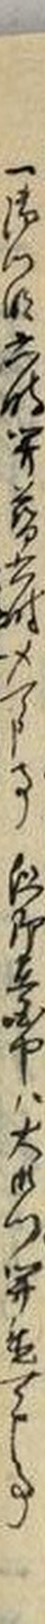一御門明六時開暮六時〆可申事但御在国中は大御門開置可申候事
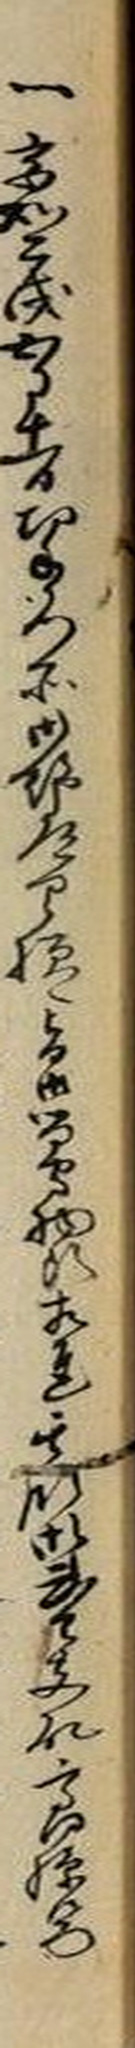一享和二戌五月十一日切手御門所御飾道具損候旨御留守物頭相達其段御武具支配高田孫左衛門
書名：御門御櫓之部
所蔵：福井県文書館 Fukui Prefectural Archives
